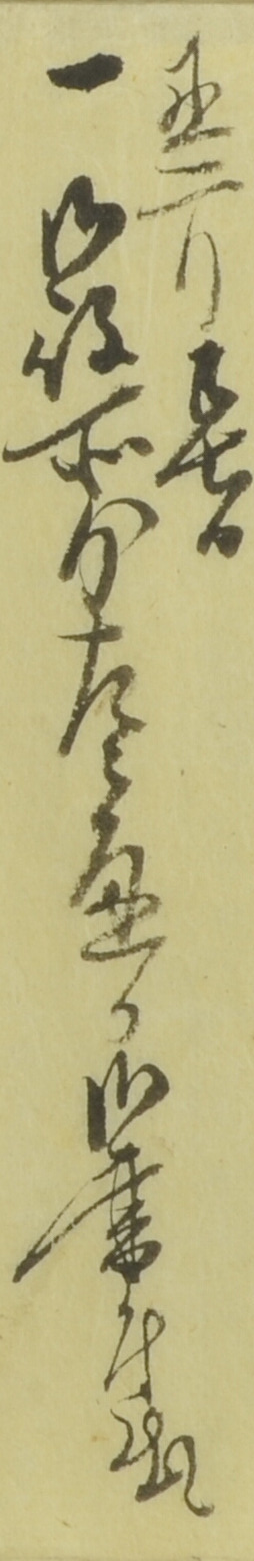一御役所ゟ左之通り御書付出候
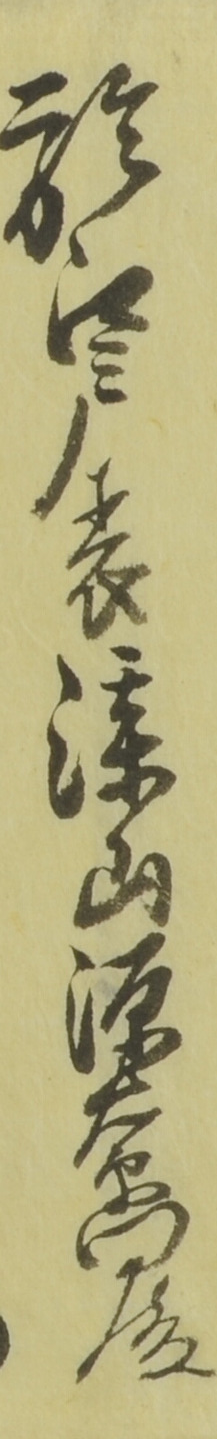於江戸表漆山源右衛門殿
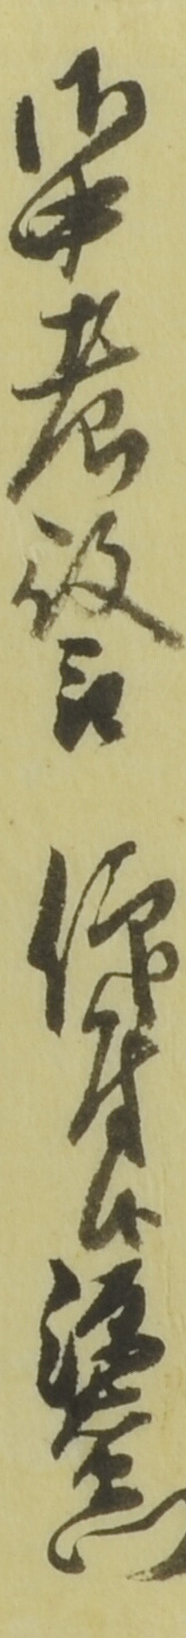御中老役被仰付候源右衛門
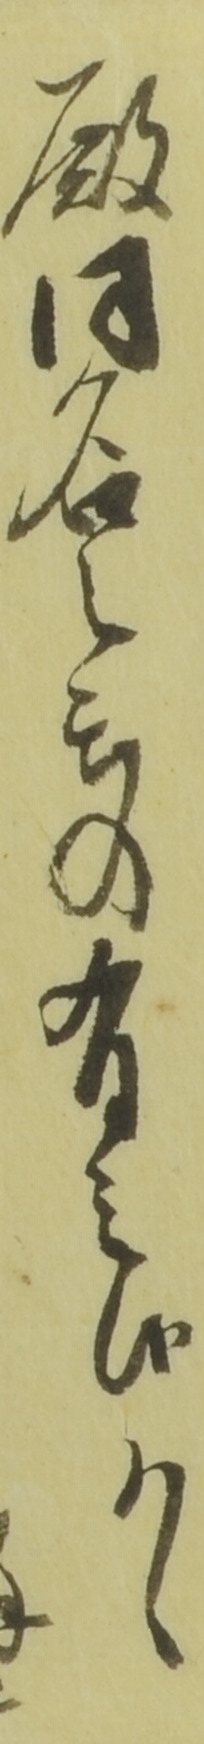殿同名之もの有之候ハヽ
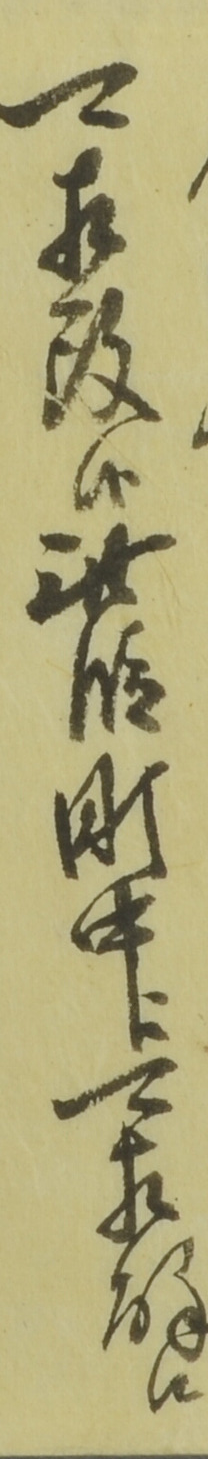可相改候此段町中江可相触候
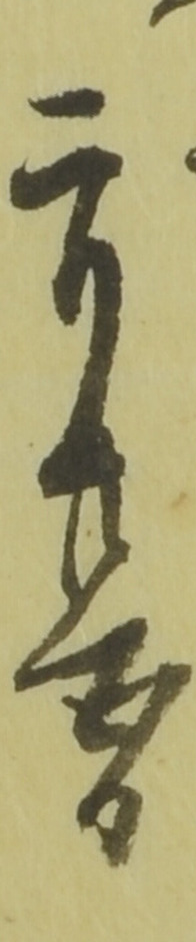二月廿五日
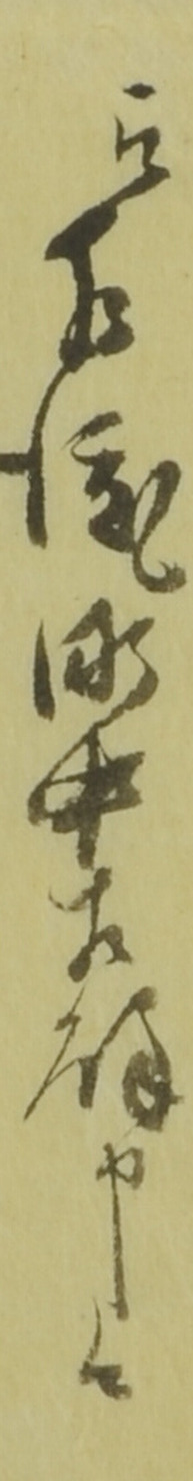江相渡シ町中相触申候
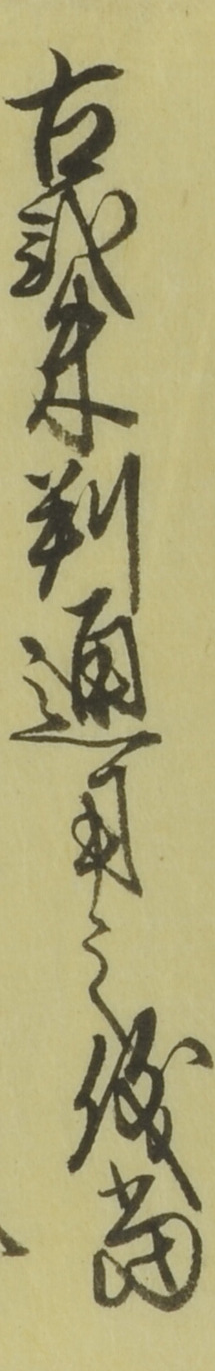古弐朱判通用之儀当
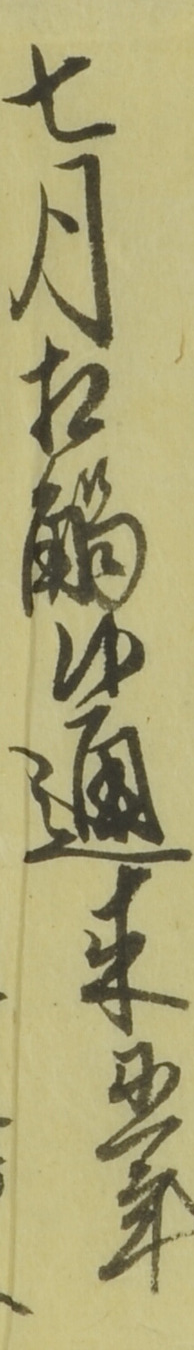七月相触候通来丑年
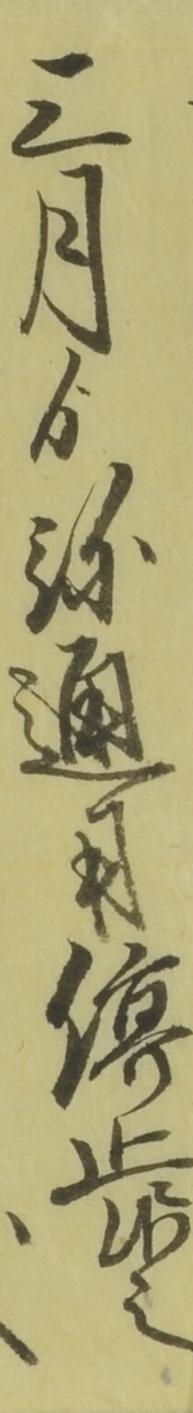三月ゟ弥通用停止ニ候之
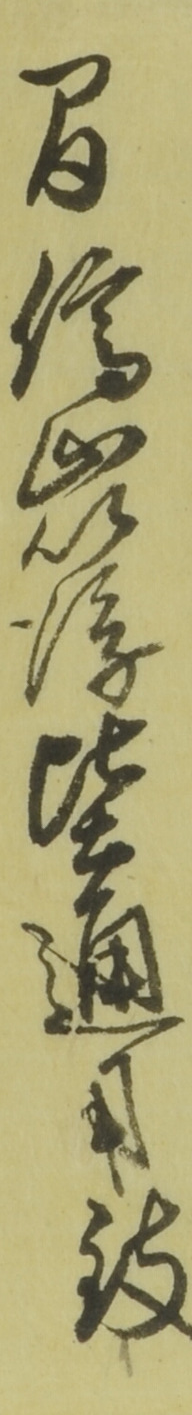間停止以後堅通用致
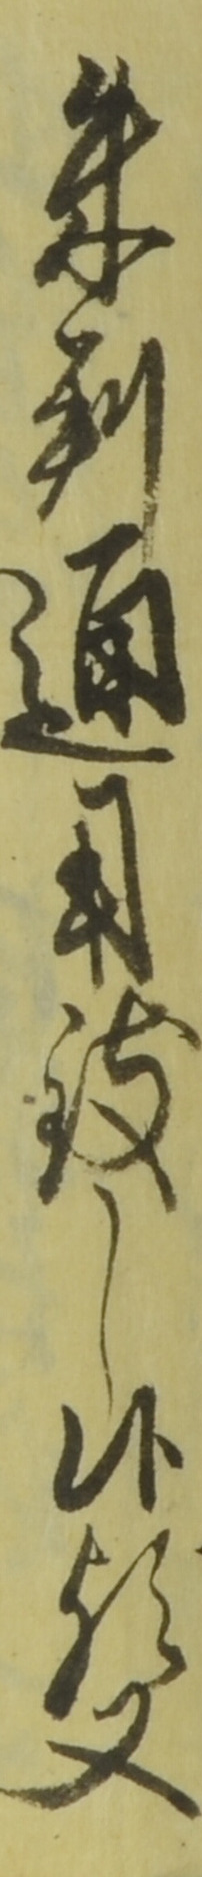朱判通用致し候猶又
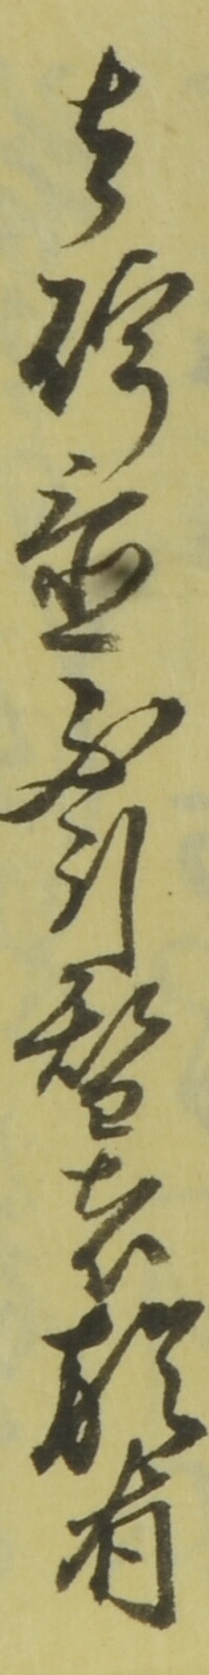は貯置不引替は猶有之
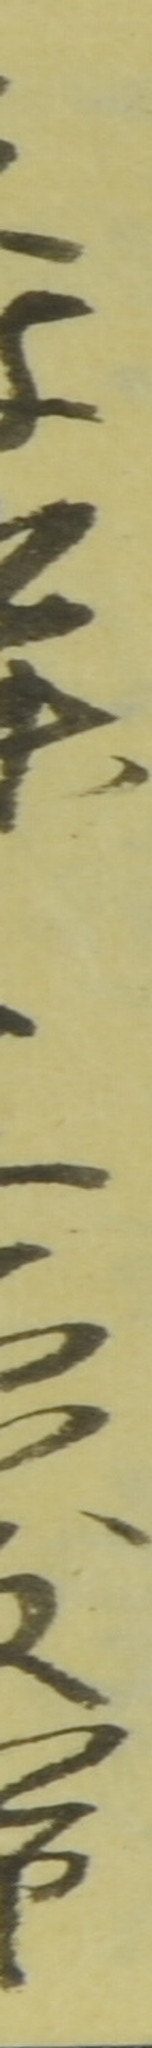之は吟味之上急度可申

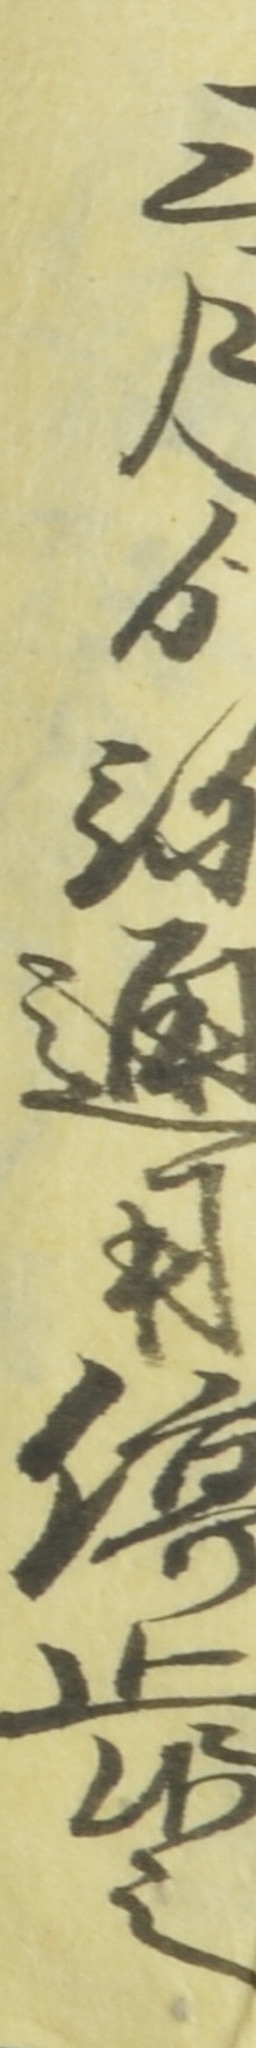三月ゟ弥通用停止ニ候之
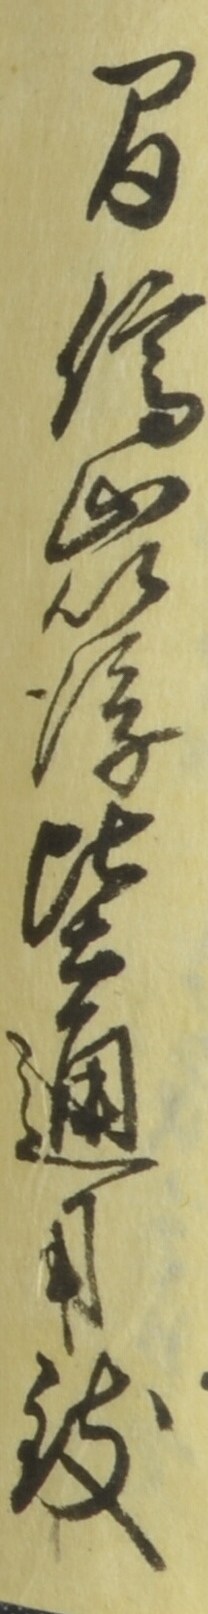間停止以後堅通用致
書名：御触書御書附控
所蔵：伊那市立高遠町図書館・合同会社AMANE
